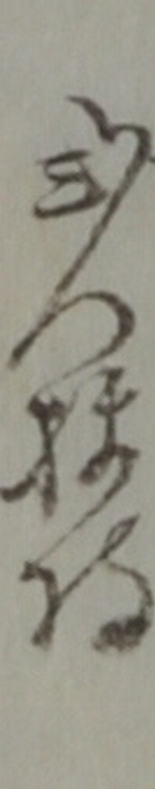弐人扶持
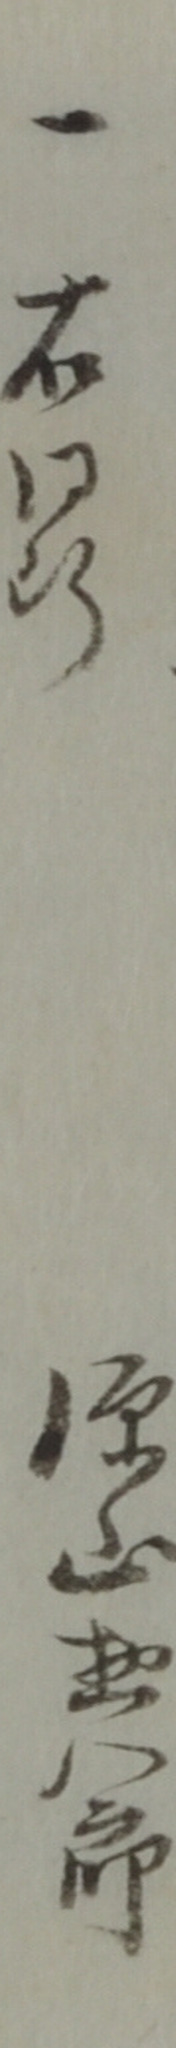一右同断原山惣八郎
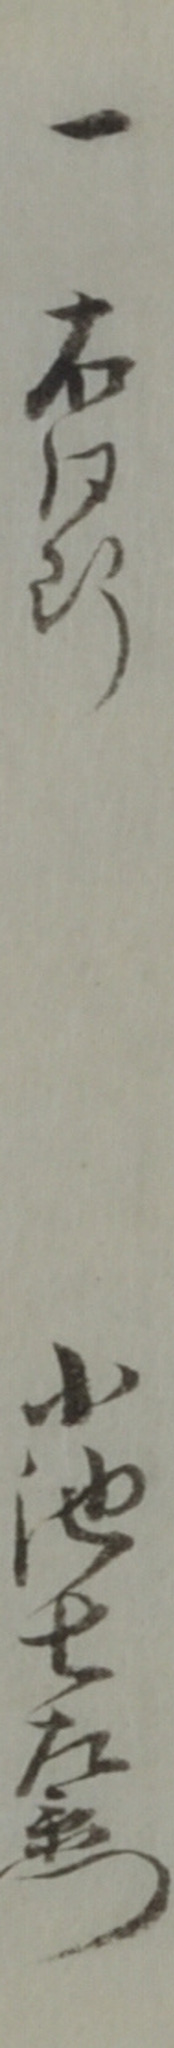一右同断小池七左衛門
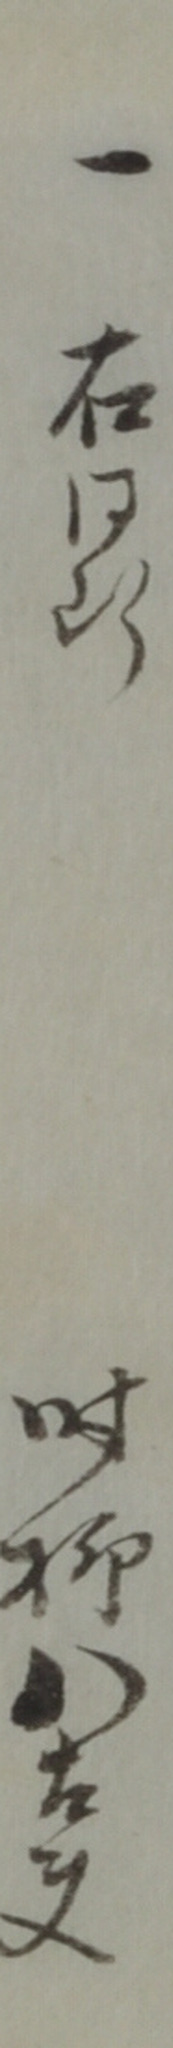一右同断時柳八太夫
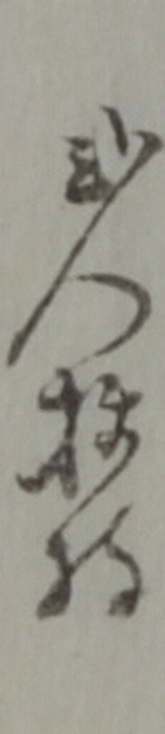弐人扶持
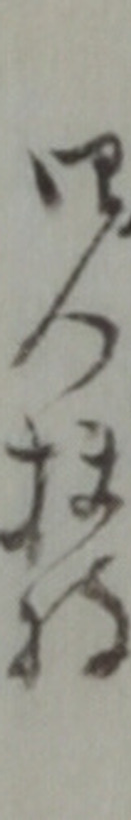四人扶持
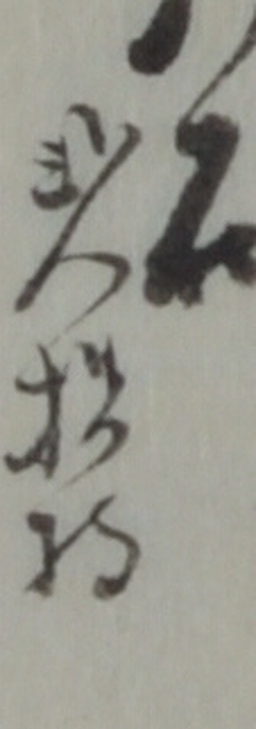弐人扶持
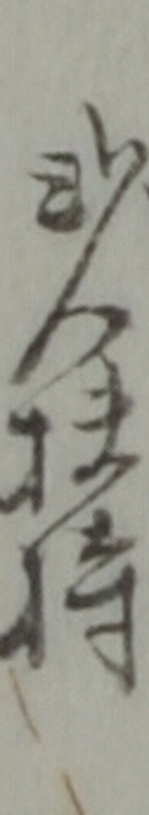弐人扶持
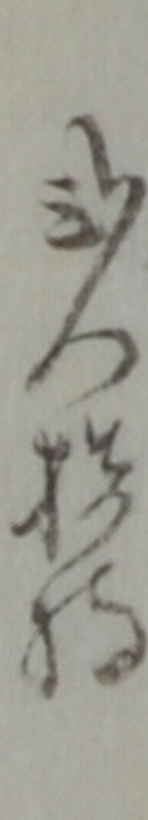弐人扶持
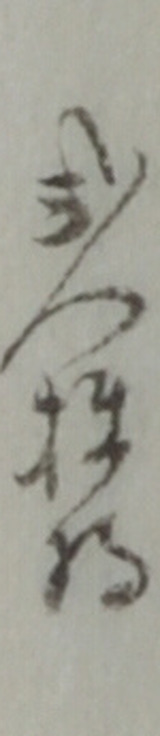弐人扶持

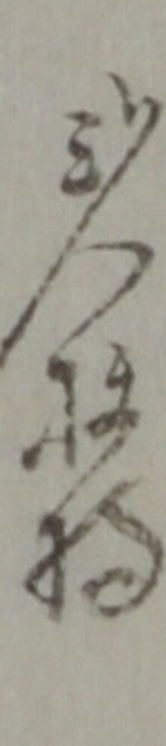弐人扶持
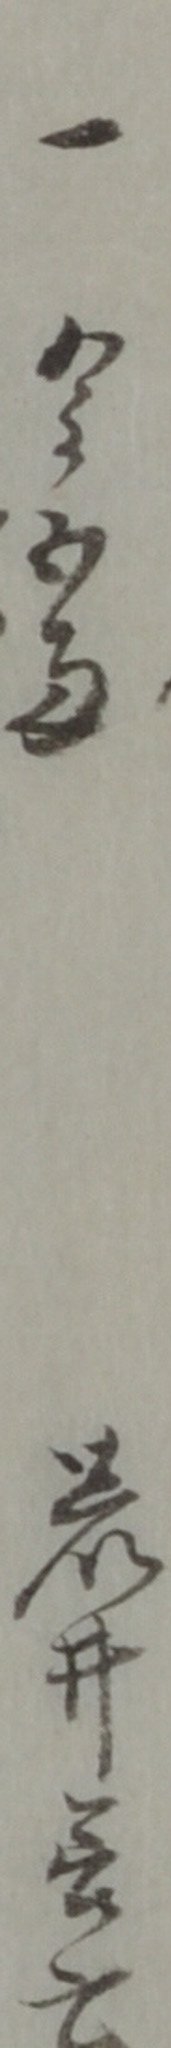一金五両荒井善六
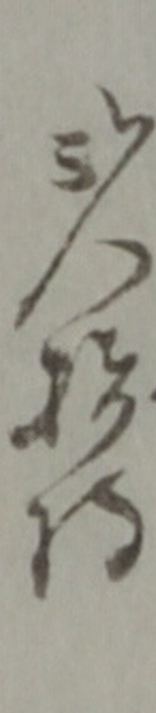弐人扶持
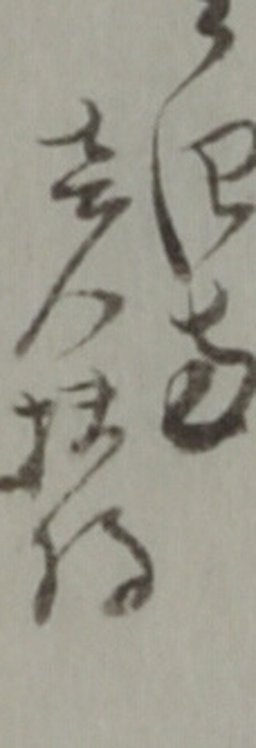壱人扶持
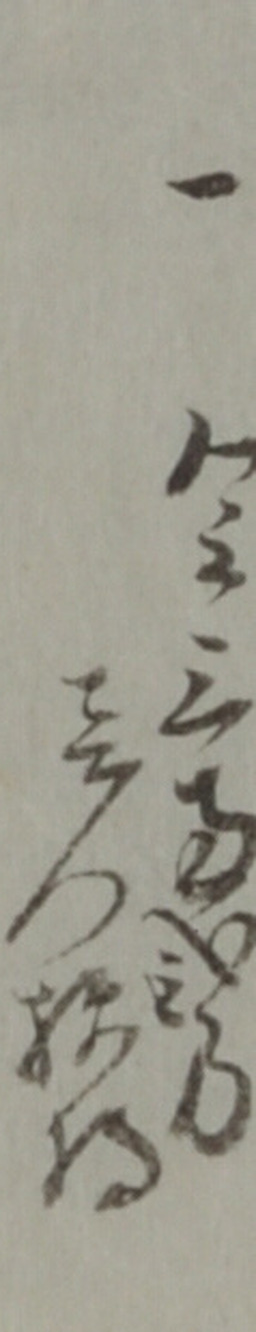壱人扶持
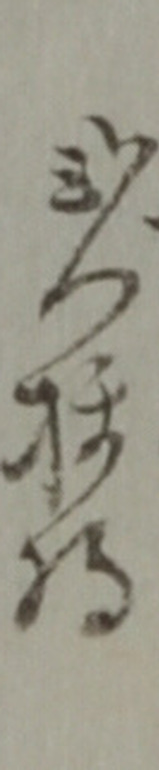弐人扶持
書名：内藤重頼公御代分限帳（写）
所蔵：伊那市立高遠町図書館・合同会社AMANE
